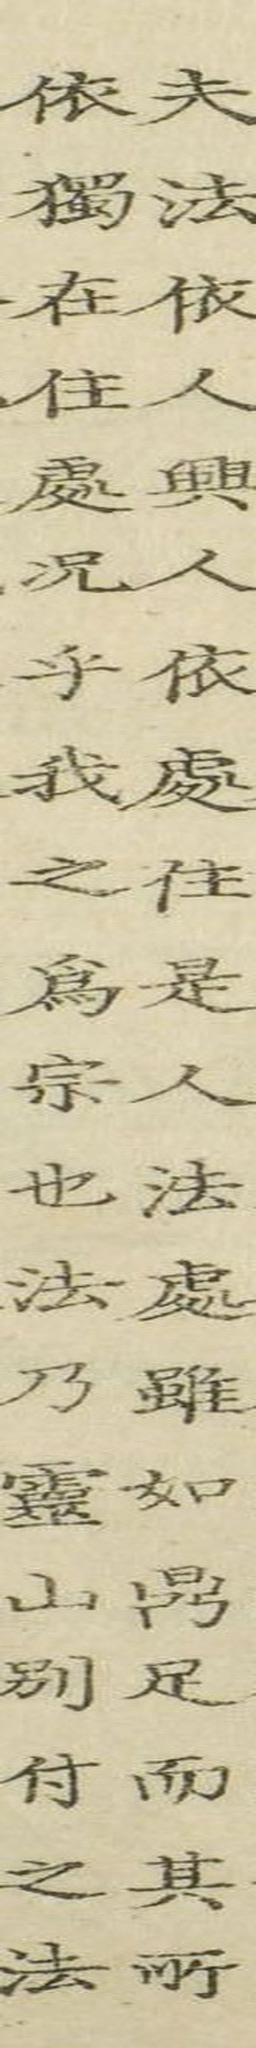依獨在住處况乎我之爲宗也法乃靈山別付之法
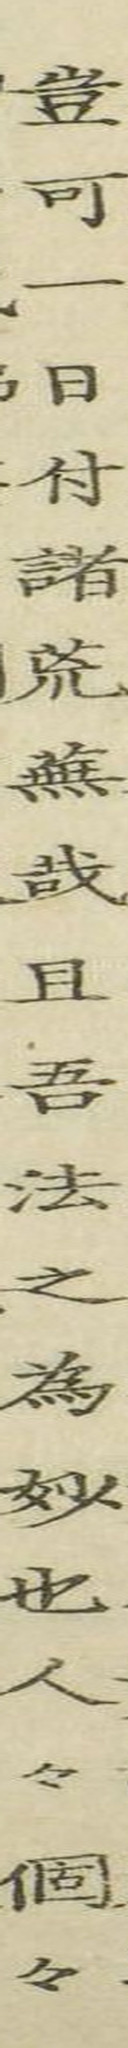豈可一日付諸荒蕪哉且吾法之為妙也人々個々
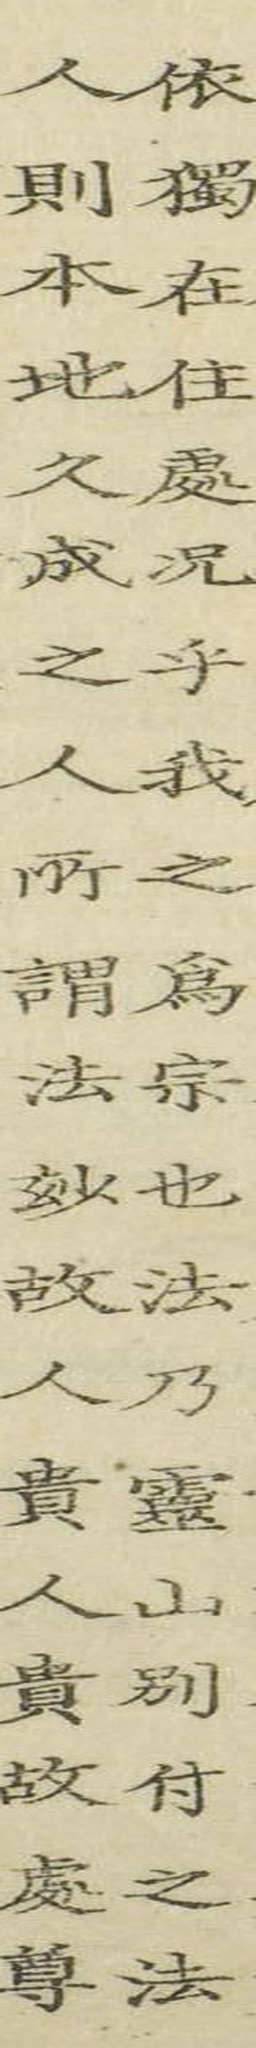人則本地久成之人所謂法玅故人貴人貴故處尊
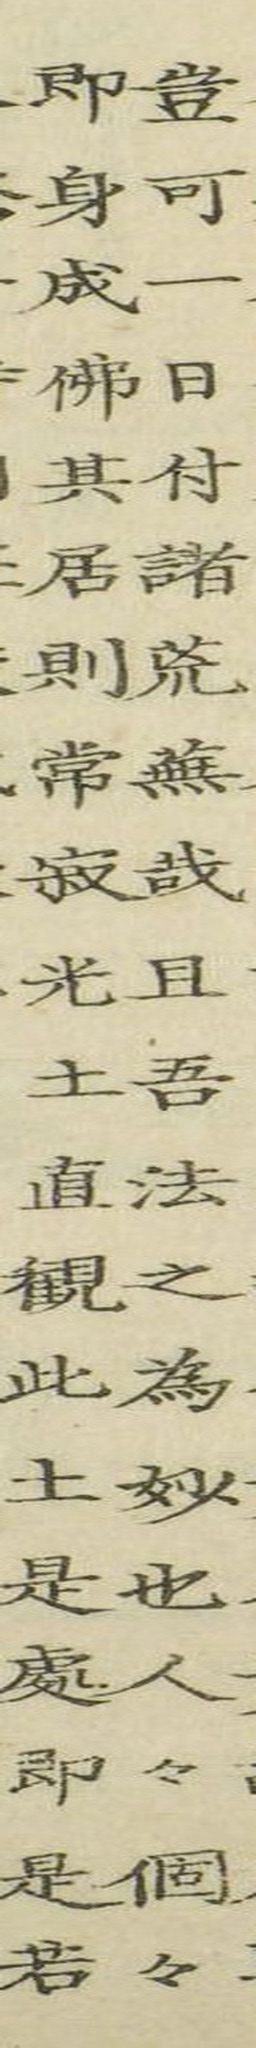即身成佛其居則常寂光土直観此土是處即是若
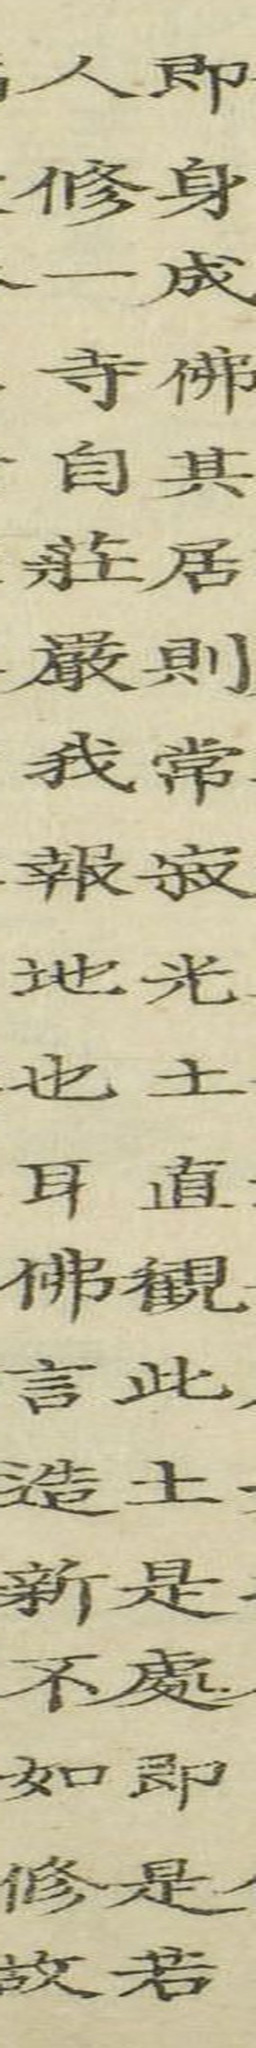人修一寺自莊嚴我報地也耳佛言造新不如修故
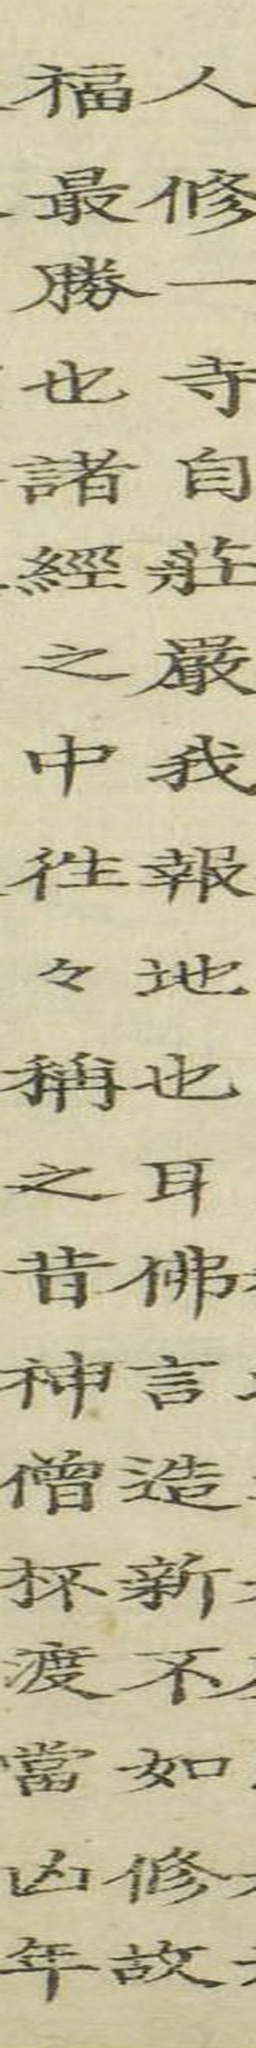福最勝也諸經之中往々稱之昔神僧杯渡當凶年
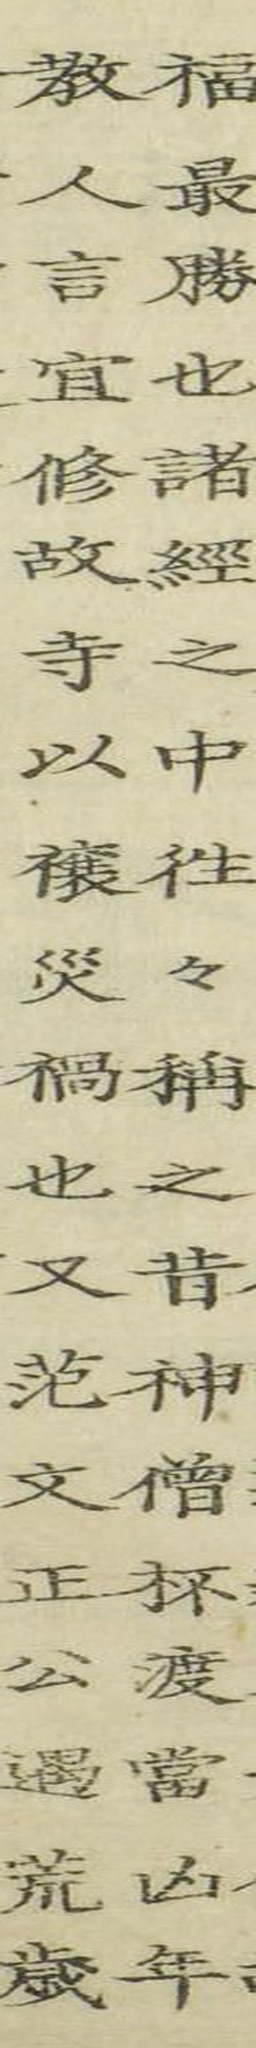教人言宜修故寺以穣災禍也又范文正公遇荒歳
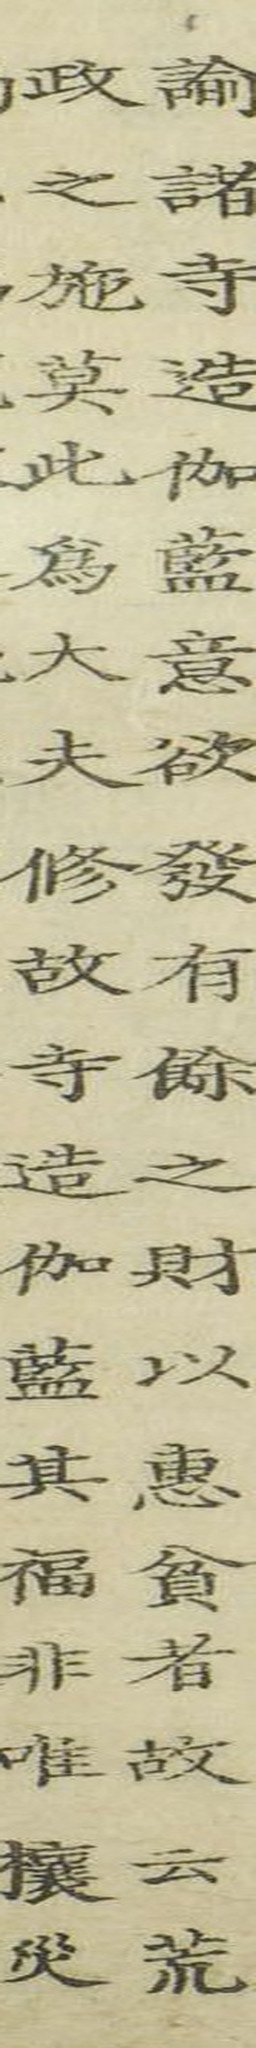政之施莫此爲大夫修故寺造伽藍其福非唯欀災
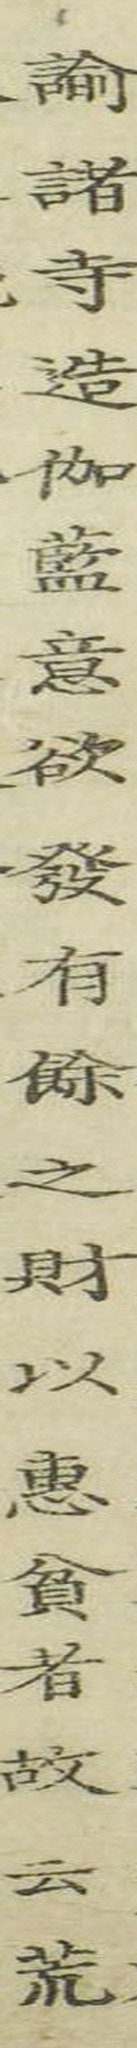諭諸寺造伽藍意欲發有餘之財以惠貧者故云荒
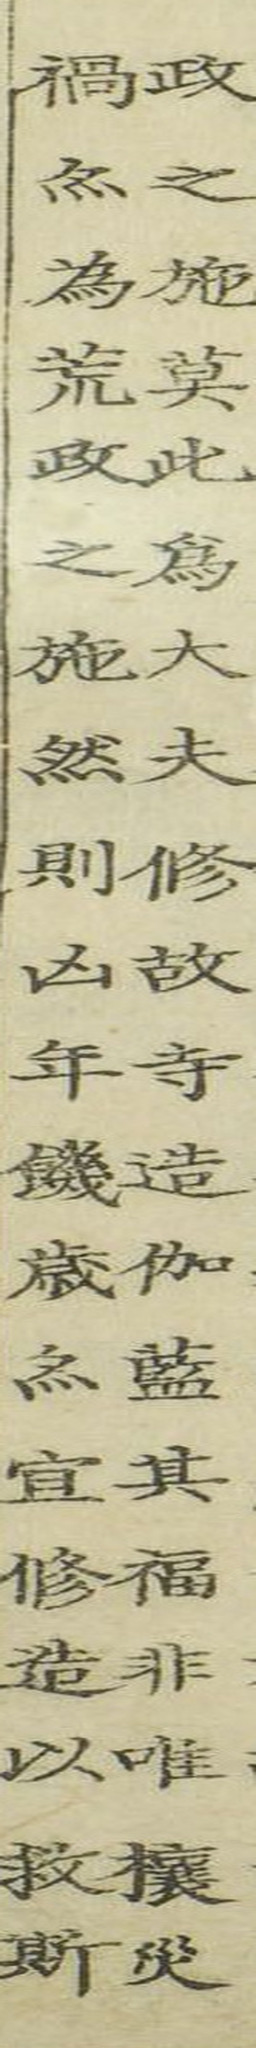禍𬉹為荒政之施然則凶年饑歳𬉹宜修造以救斯

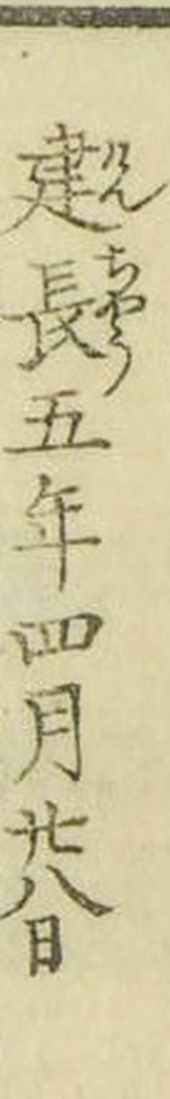建長五年四月廿八日
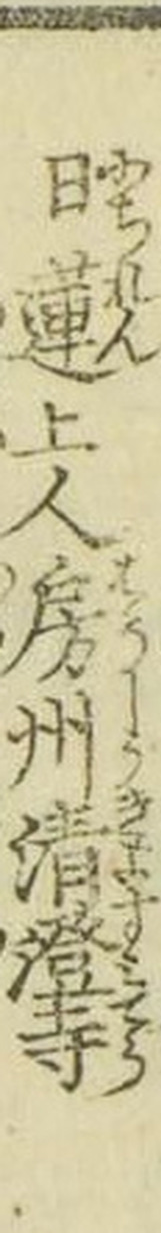日蓮上人房州清澄寺
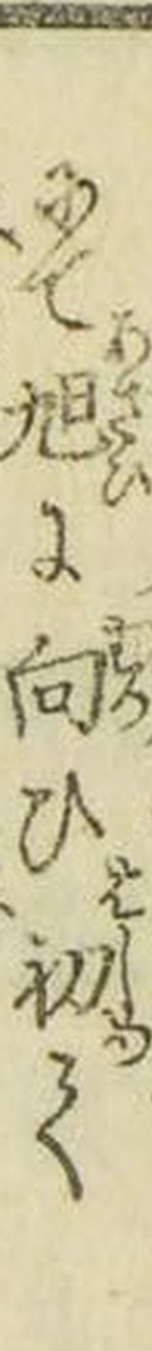にて旭に向ひ初て
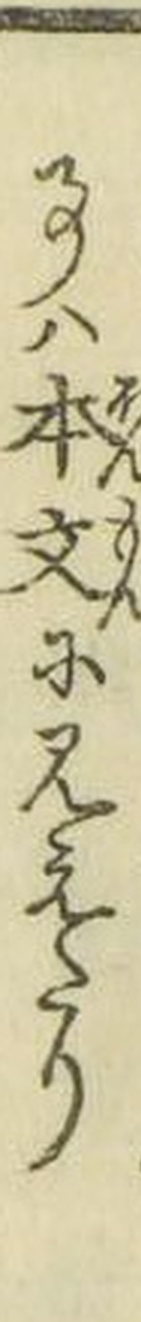事は本文に見えたり
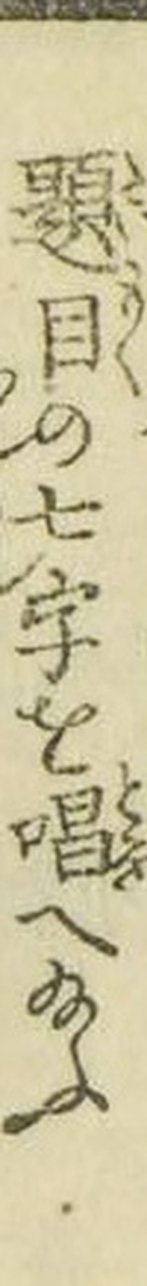題目の七字を唱へ給ふ

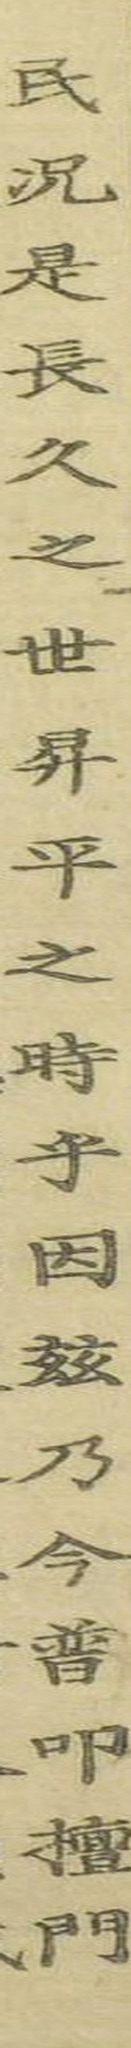民况是長久之世昇平之時乎因茲乃今普叩檀門
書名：江戸名所図会 20巻 巻之4
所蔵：東京学芸大学教育コンテンツアーカイブ
